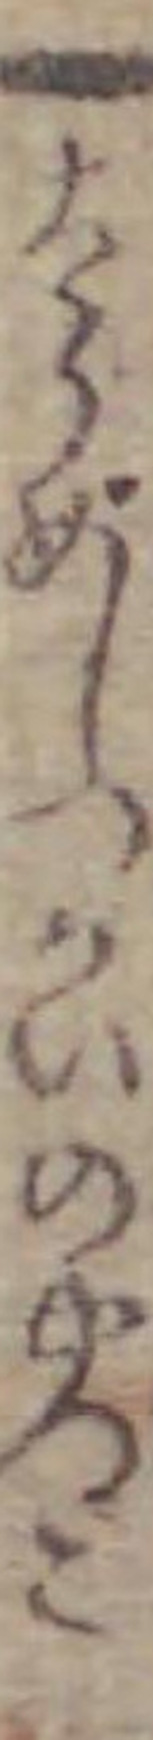太郎めしつかいのやつこ
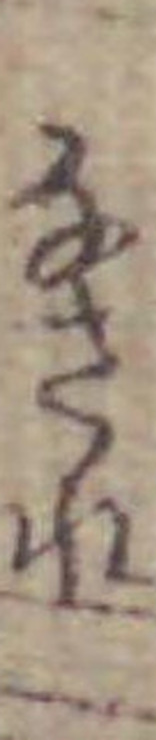なされ
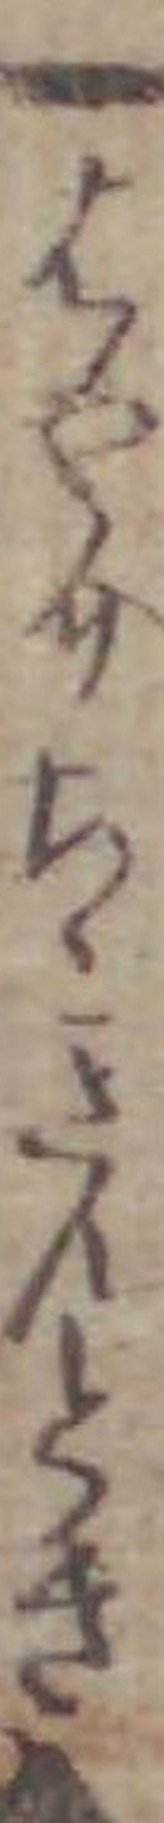はや介ちゝきんとき
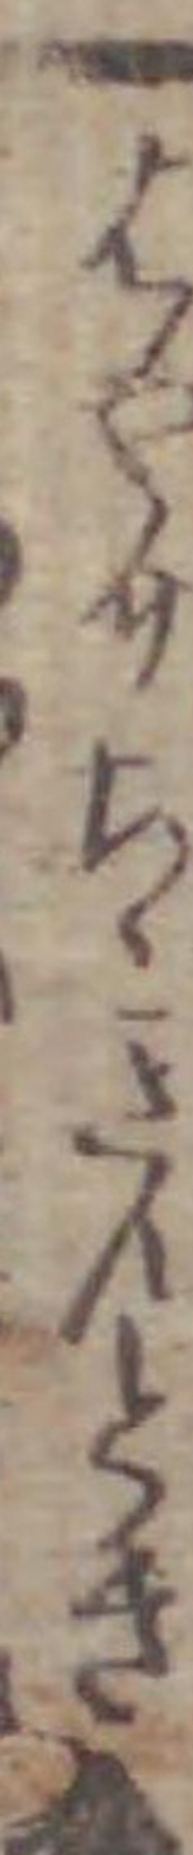はや介ちゝきんとき
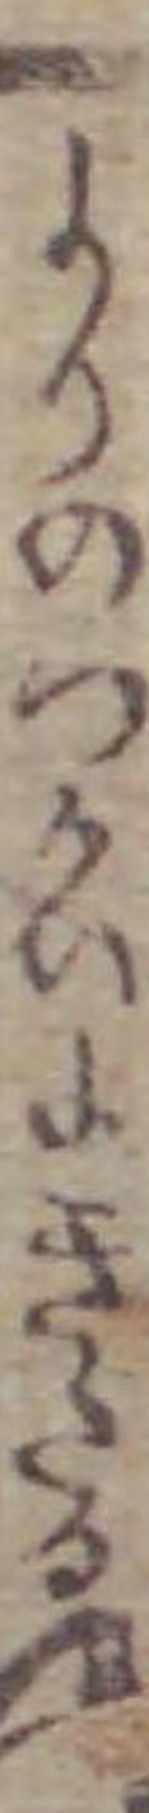よりのつかいにきたる
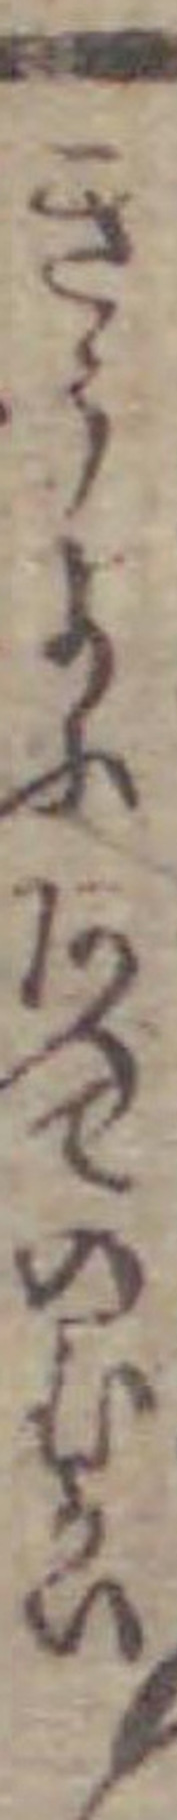きうよふあつてのむかい
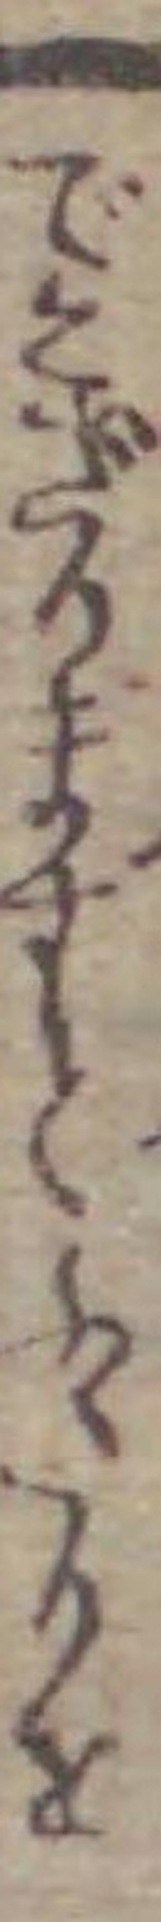でこざりますとふたりを
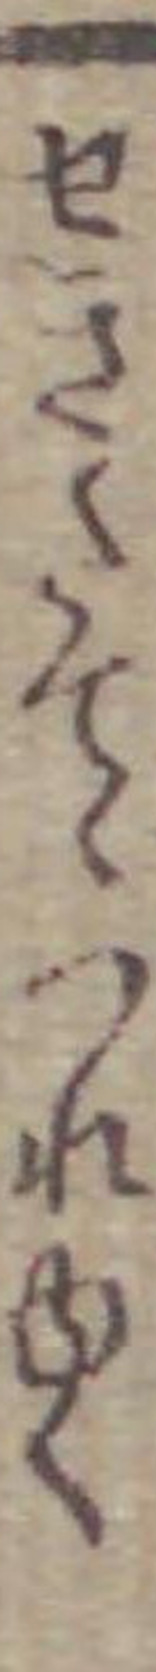せきたてゝつれてゆく
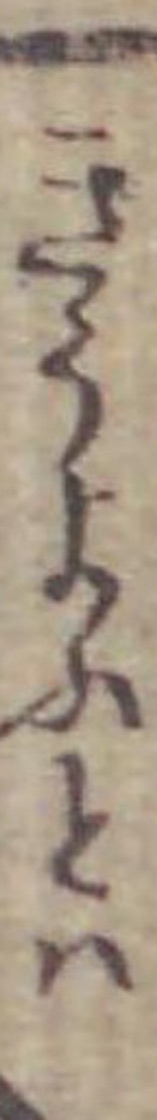きうよふとは
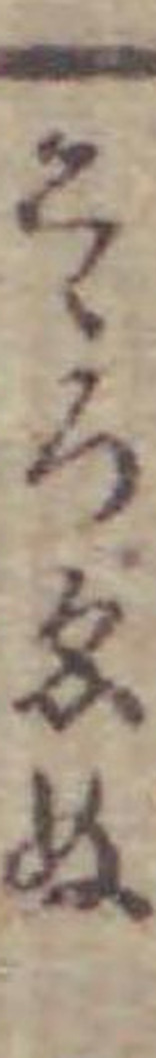こゝろゑぬ
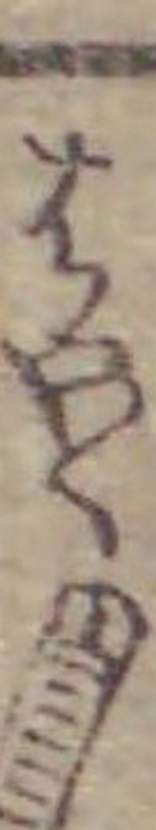はやく
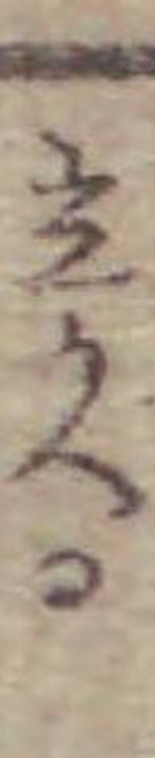立かへる
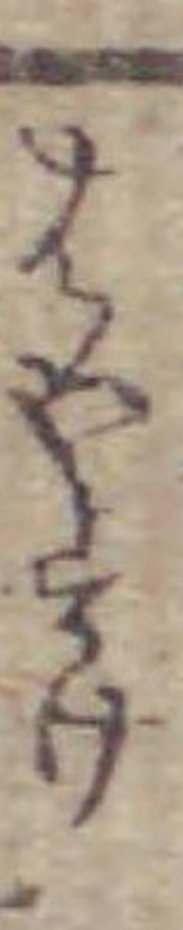はやすけ
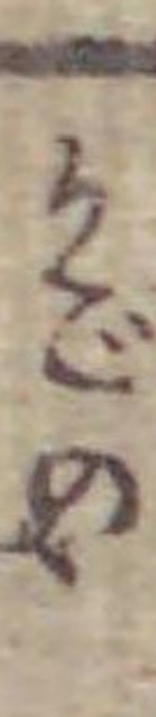かごの

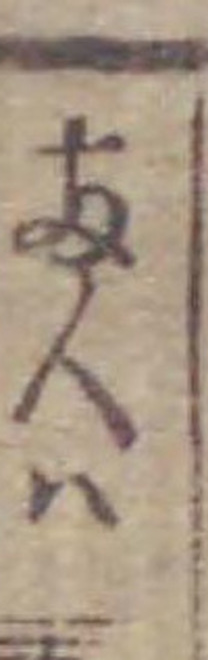両人は
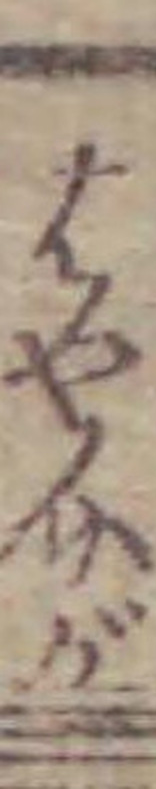はや介が
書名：二日替 : 2巻
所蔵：国立国会図書館 National Diet Library, JAPAN
